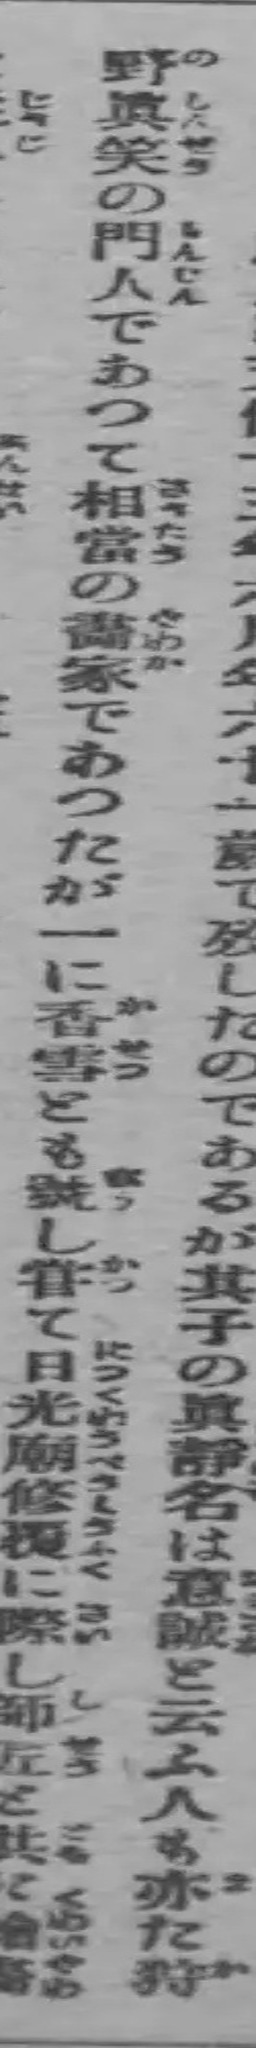山田香雪野眞笑の門人であつて相当の画家であつたが一に香雪とも号し嘗て日光廟修覆に際し師匠と共に絵画
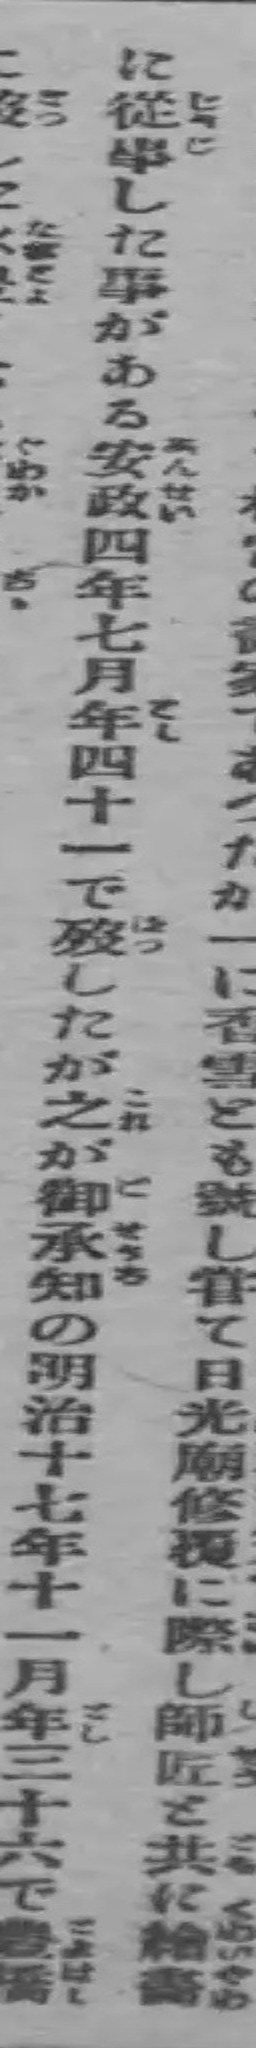に従事した事がある安政四年七月年四十一で歿したが之が御承知の明治十七年十一月年三十六で豊橋
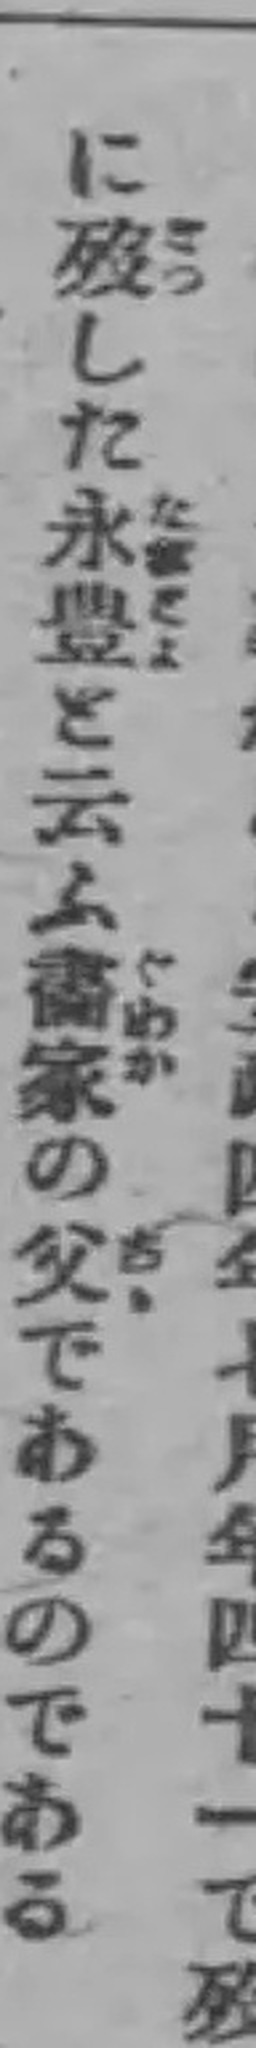に歿した永豊と云ふ画家の父であるのである
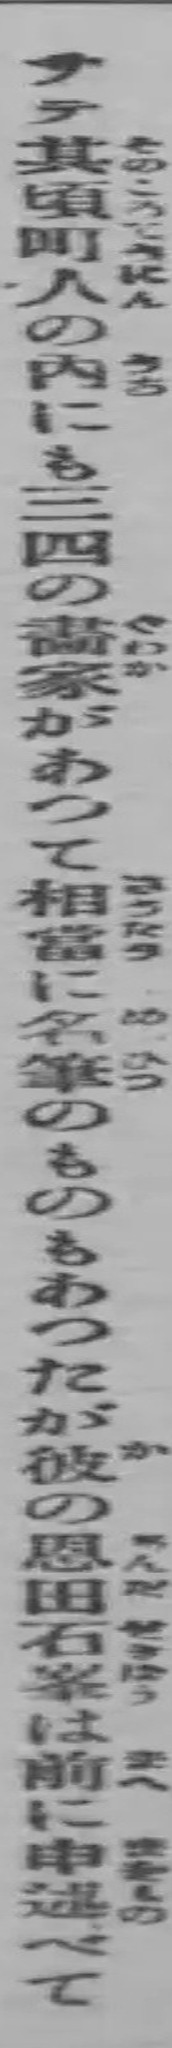恩田石峯サテ其頃町人の内にも三四の画家があつて相当に名筆のものもあつたが彼の恩田石峯は前に申述べて
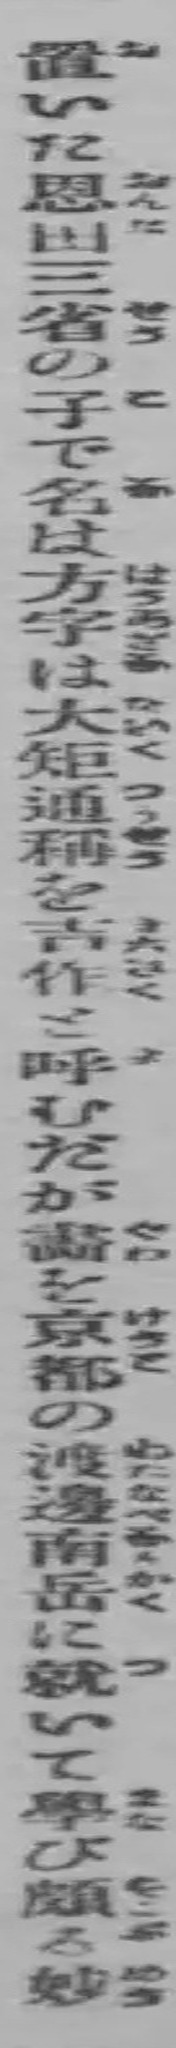置いた恩田三省の子で名は方字は大矩通称を吉作と呼むだが画を京都の渡邊南岳に就いて学び頗る妙
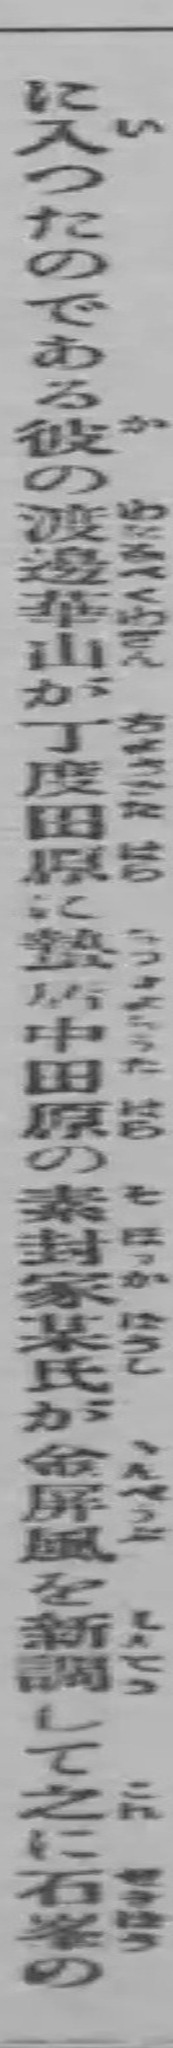に入つたのである彼の渡邊崋山が丁度田原に蟄居中田原の素封家某氏が金屏風を新調して之に石峯の
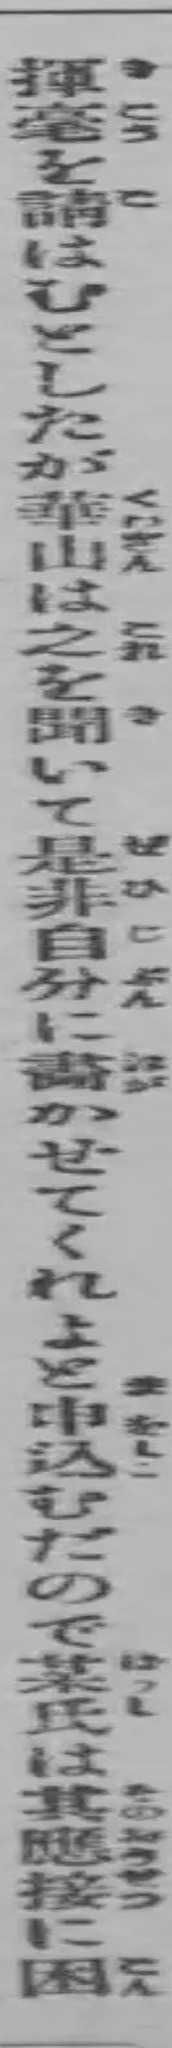揮毫を請はむとしたが崋山は之を聞いて是非自分に画かせてくれよと申込むだので某氏は其応接に困
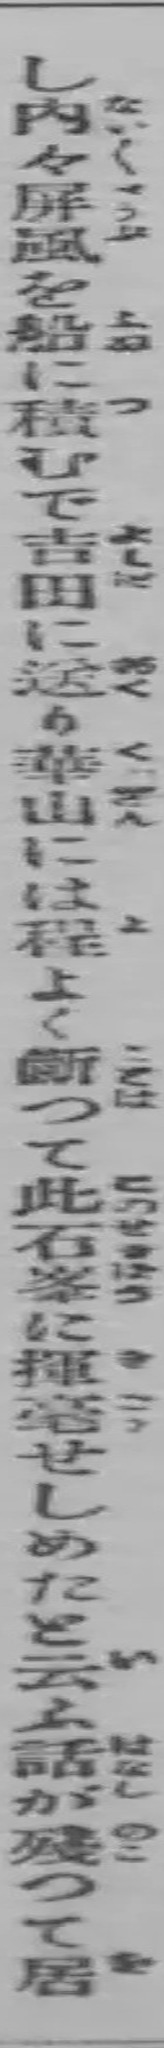し内々屏風を船に積むで吉田に送り崋山には程よく断つて此石峯に揮毫せしめたと云ふ話が残つて居
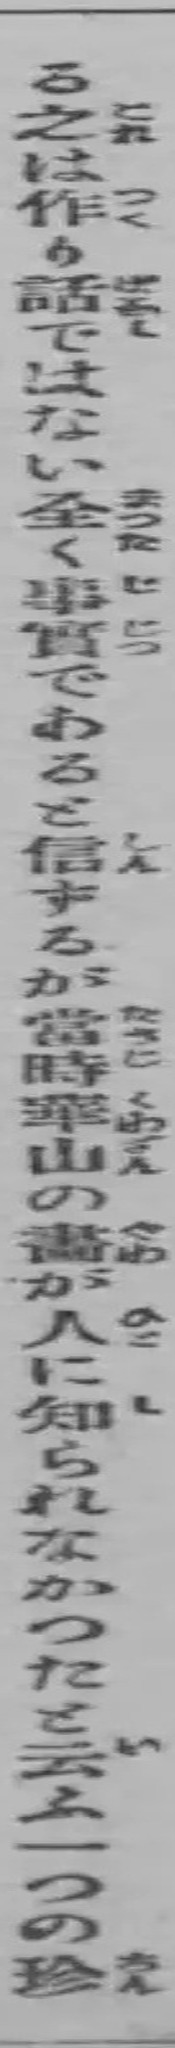る之は作り話ではない全く事実であると信ずるが当時崋山の画が人に知られなかつたと云ふ一つの珍
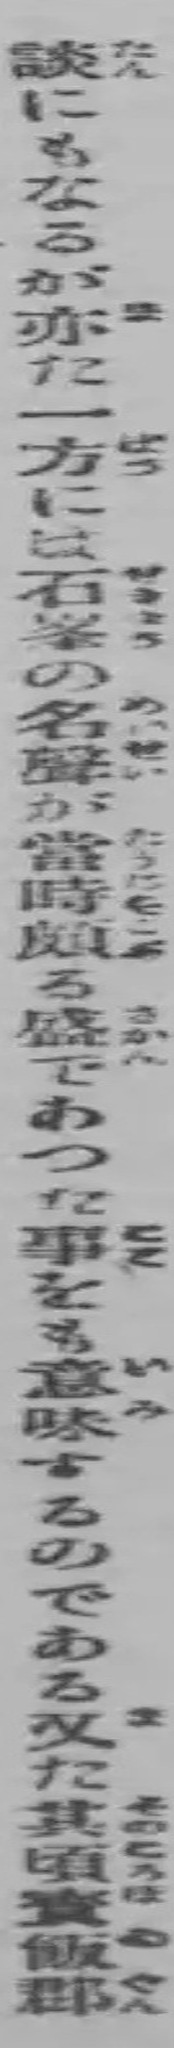談にもなるが亦た一方には石峯の名声が当時頗る盛であつた事をも意味するのである又た其頃宝飯郡
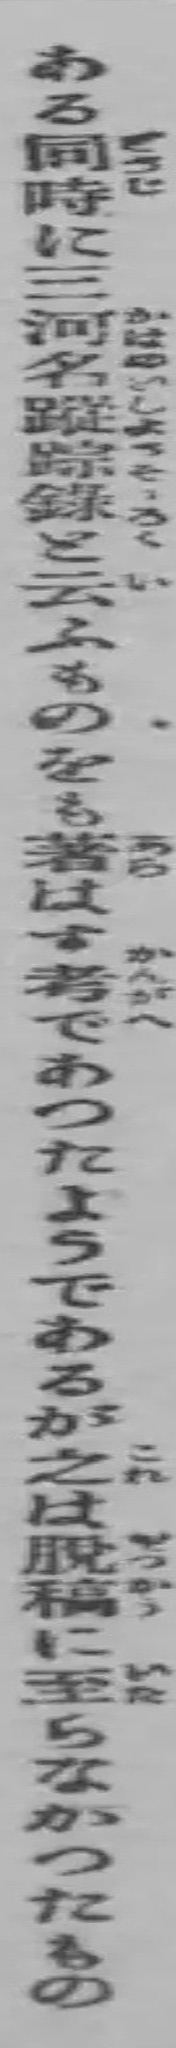ある同時に三河名蹤踪録と云ふものをも著はす考であつたようであるが之は脱稿に至らなかつたもの
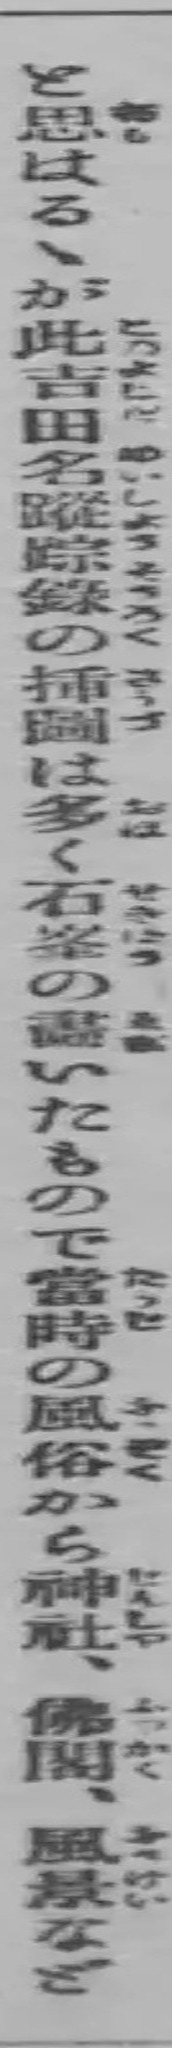と思はるゝが此吉田名蹤踪録の挿図は多く石峯の画いたもので当時の風俗から神社、仏閣、風景など
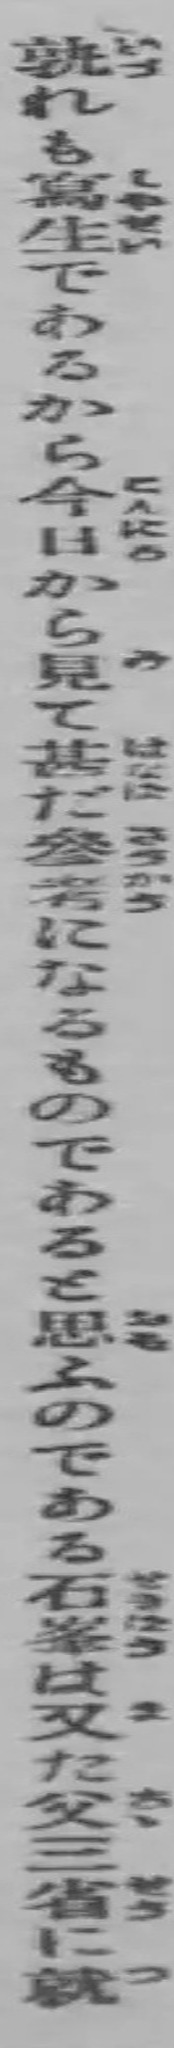孰れも写生であるから今日から見て甚だ参考になるものであると思ふのである石峯は又た父三省に就
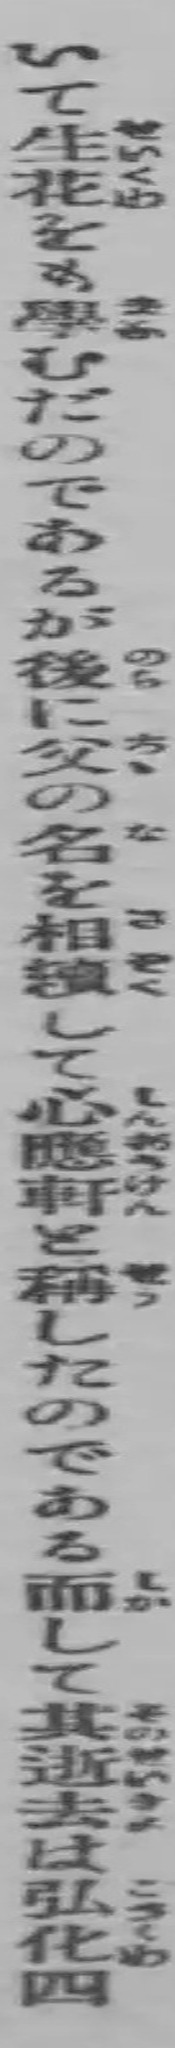いて生花をも学むだのであるが後に父の名を相続して心応軒と称したのである而して其逝去は弘化四
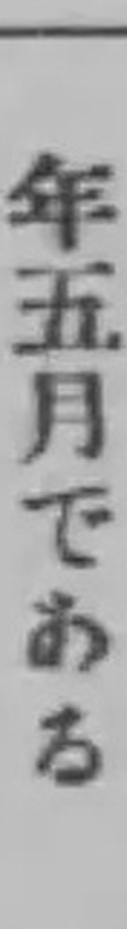年五月である
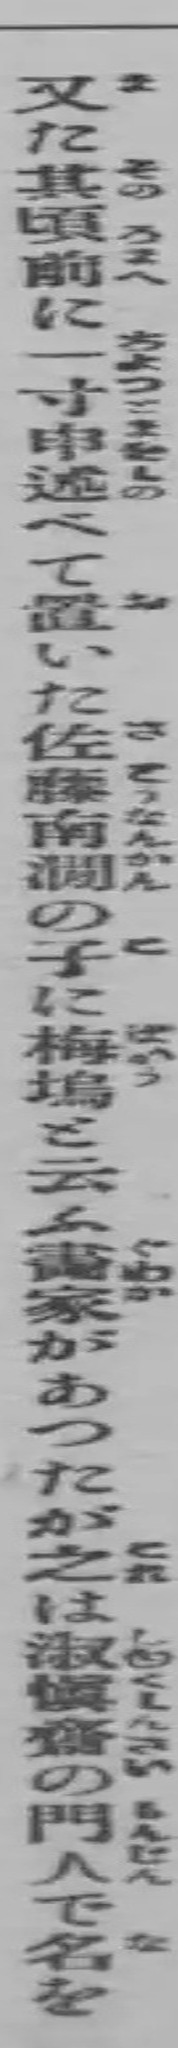佐藤大寛又た其頃前に一寸申述べて置いた佐藤南澗の子に梅塢と云ふ画家があつたが之は淑慎斉の門人で名を
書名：豊橋市史談
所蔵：国立国会図書館 National Diet Library, JAPAN
